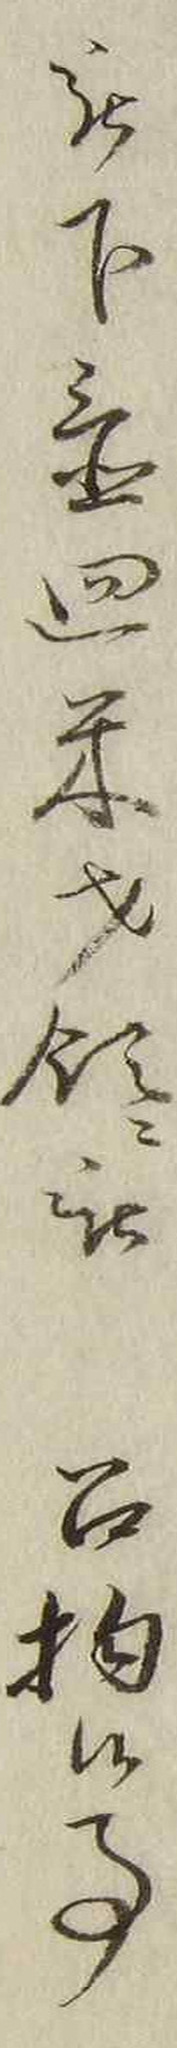被下置廻米才領ニ被召抱候事

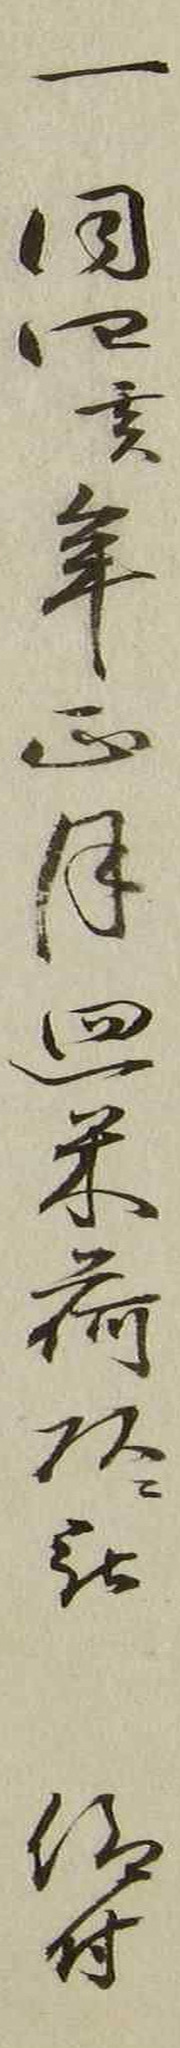一同四亥年正月廻米荷頭ニ被仰付
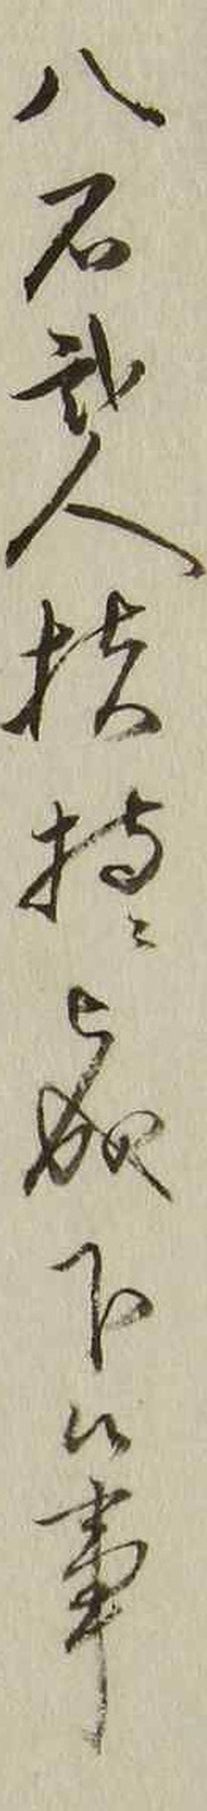八石弐人扶持ニ被成下候事
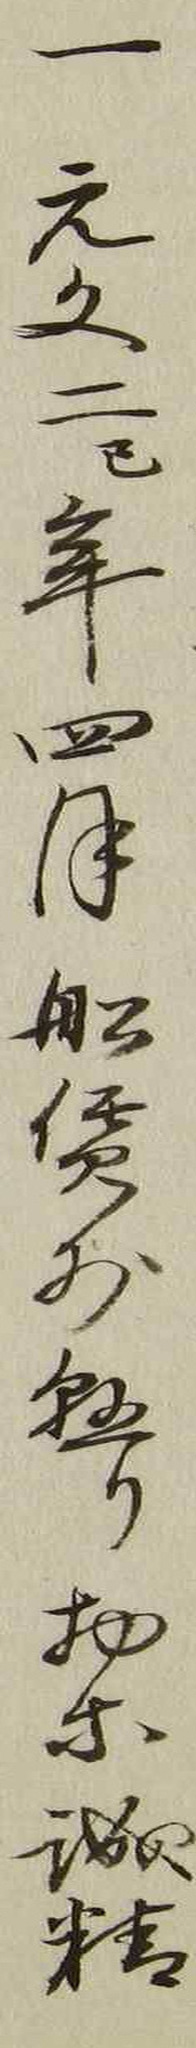一元文二巳年四月舩賃外懸り物等誠精
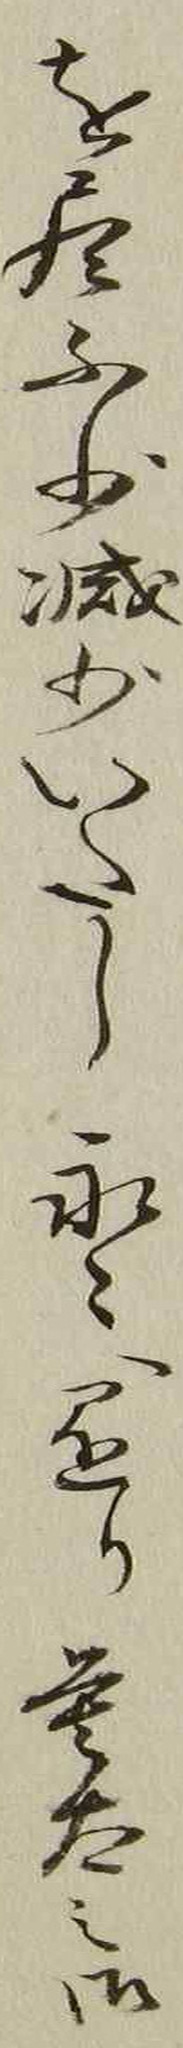を尽ふ少減少いたし永々へ懸り豊太之御
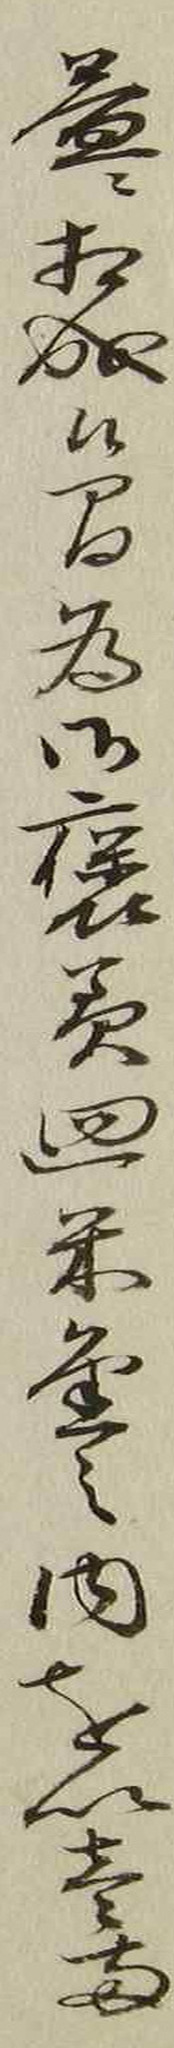益ニ相成候間為御褒美廻米金之内を以壱両
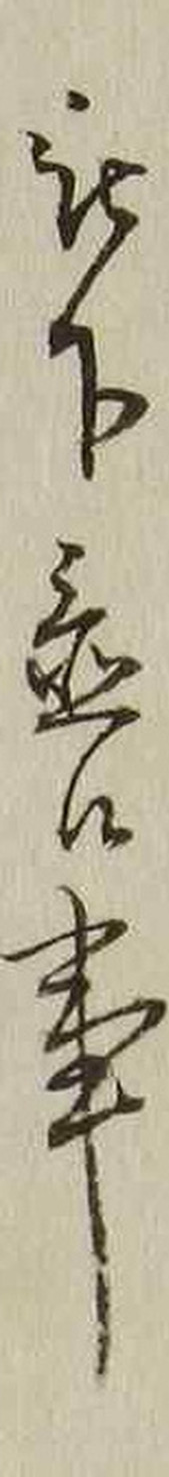被下置候事
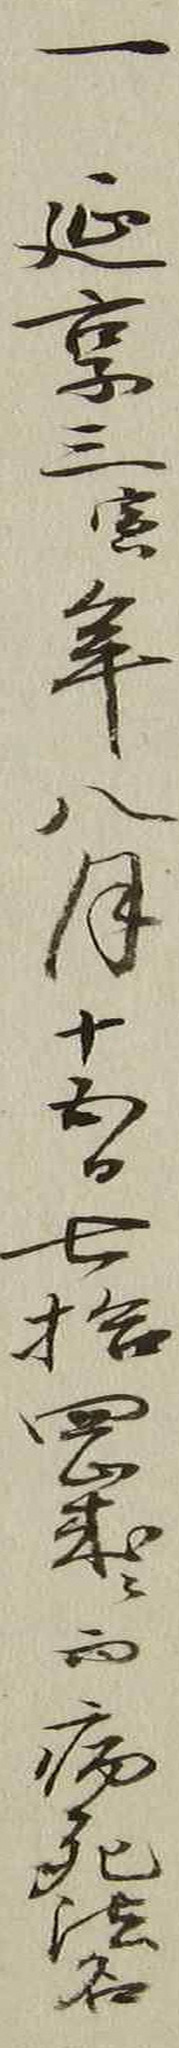一延享三寅年八月十五日七拾四歳ニ而病死法名
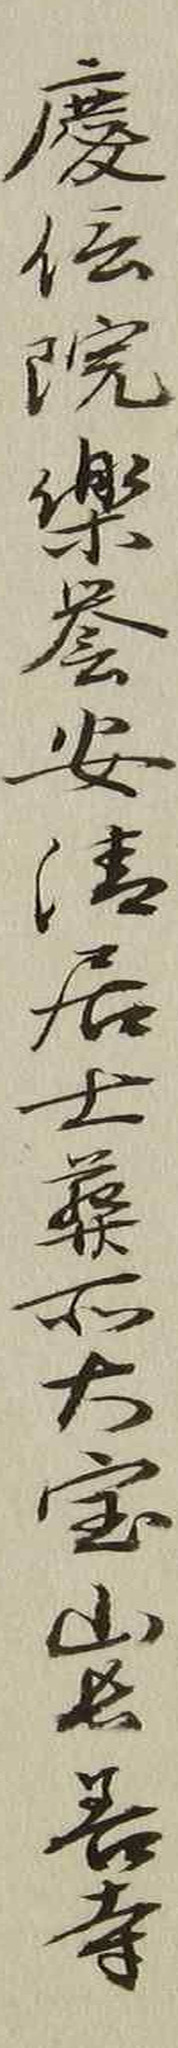慶信院楽誉安清居士葬所大宝山長善寺
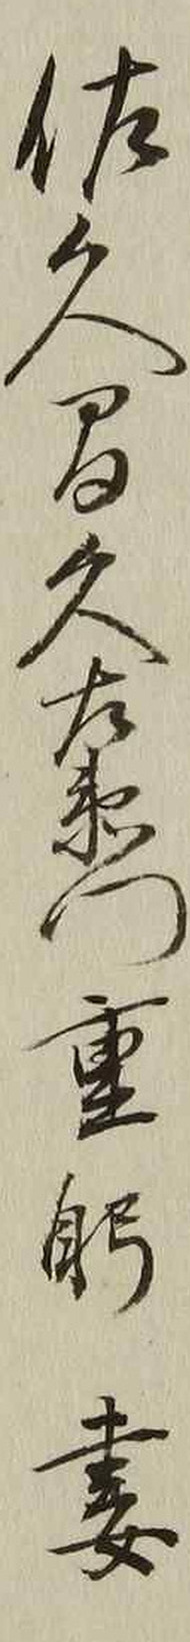女佐久間久右衛門重躬妻
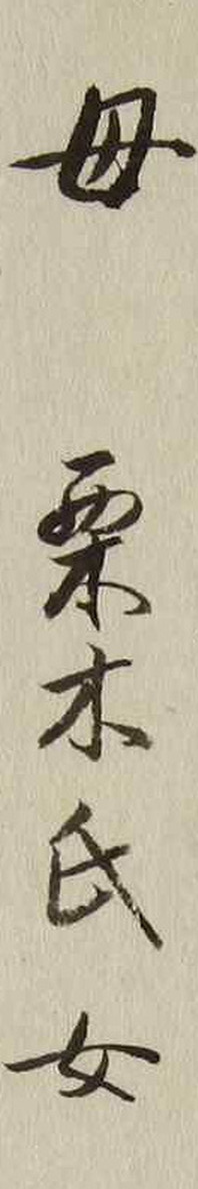母栗木氏女
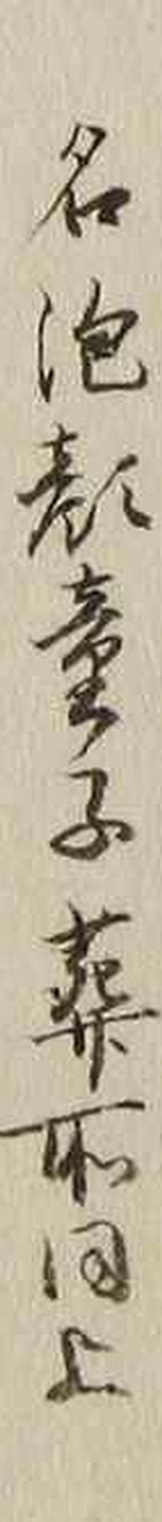名泡顔童子葬所同上
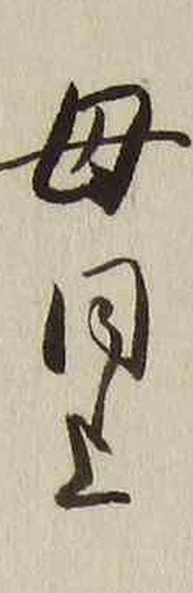母同上
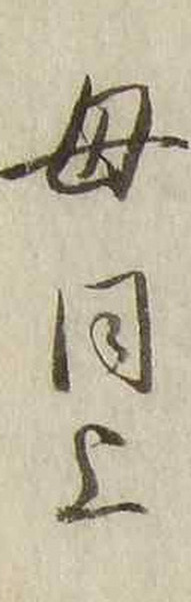母同上

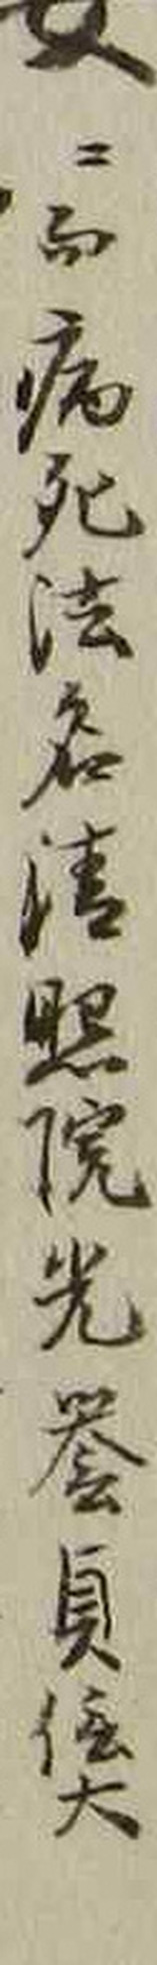二而病死法名清照院光誉貞信大
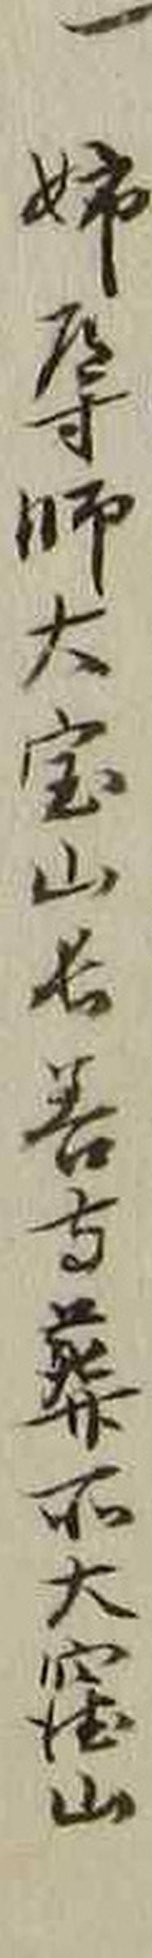姉導師大宝山長善寺葬所大窪山
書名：諸士系譜　巻之114　か之部22
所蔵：会津若松市立会津図書館
